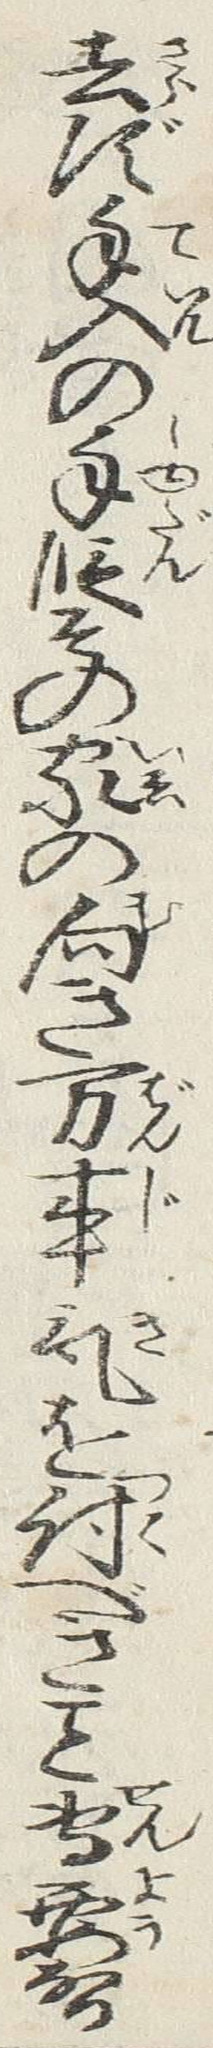去ず手入の手段その家の向き万事気を付べきこと専要なり
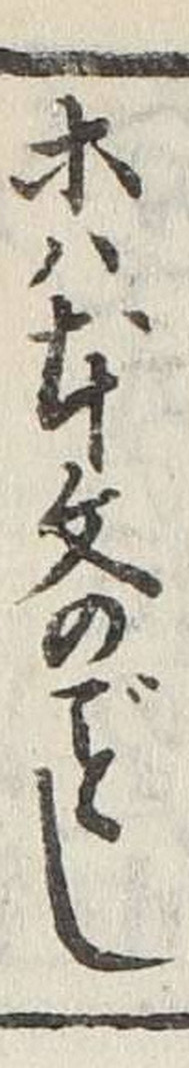等は本文のごとし
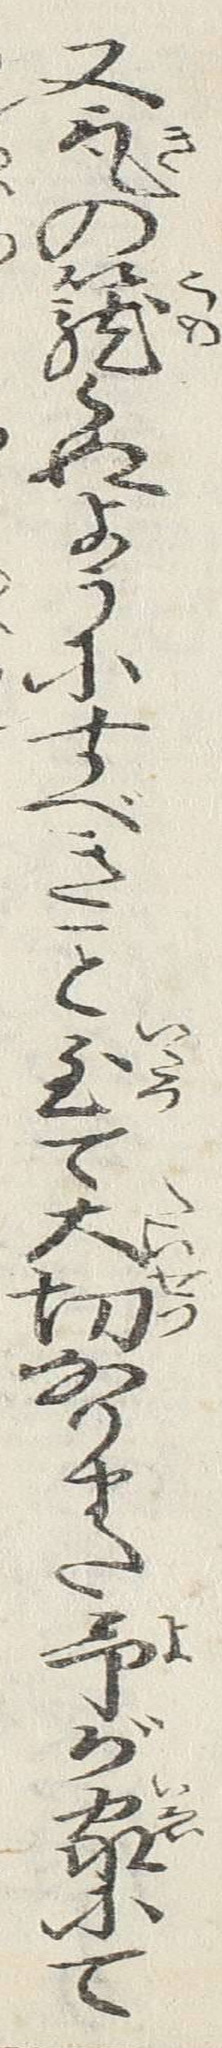又気の籠らぬようにすべきこと至て大切なりまた予が家にて
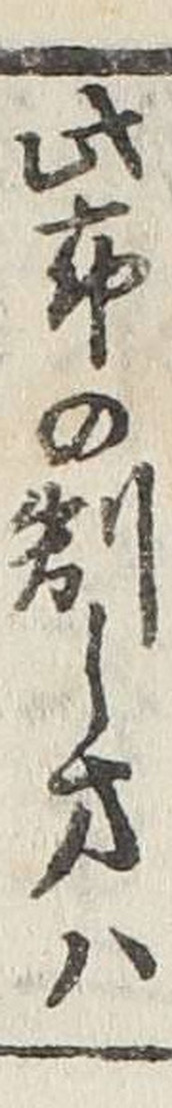此布の制し方は
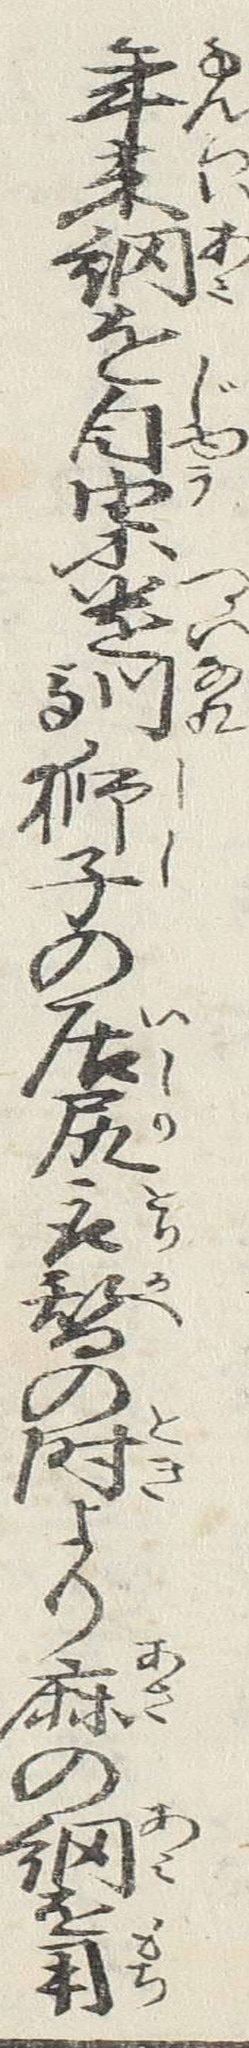年来網を自由に遣馴獅子の居尻取替の時より麻の網を用
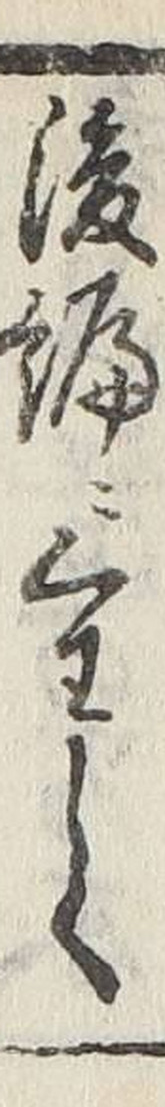後編にくわしく
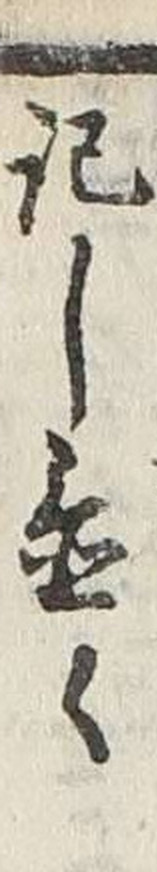記し置く
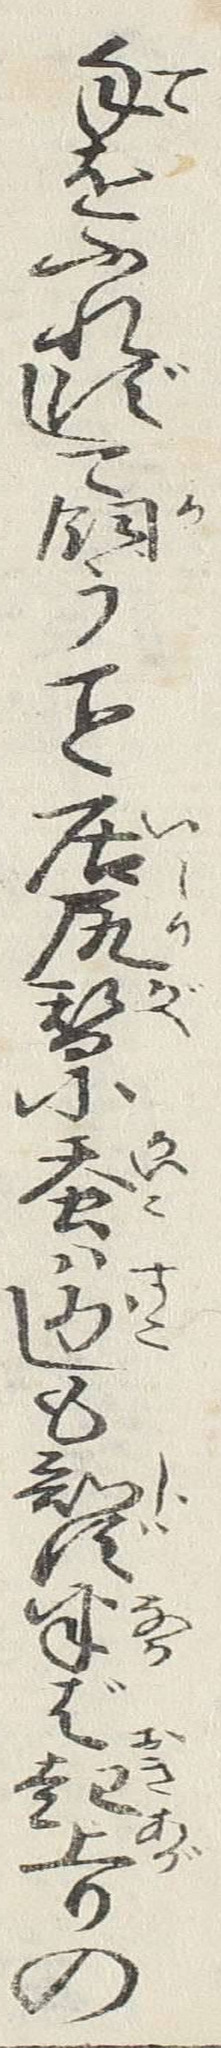手をふれずして飼うこと居尻替に蚕は少しも知ず半ば起上りの
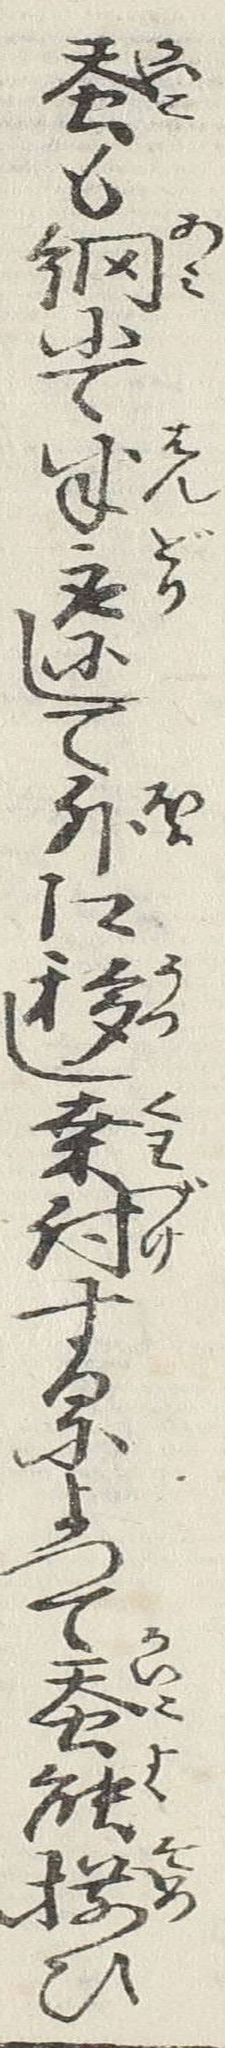蚕も網にて半取にして外え移し桑付するによつて蚕能揃ひ
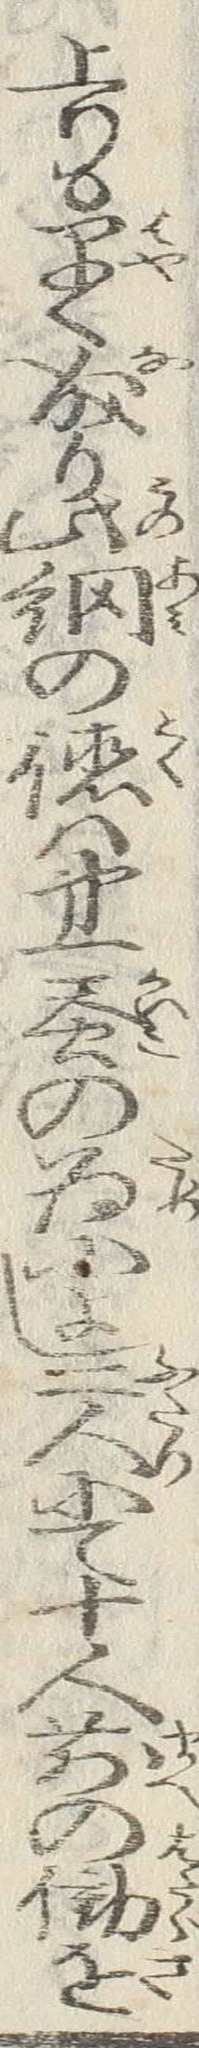上りも早く成り此網の徳は第一蚕の為によし二人にて十人前の働を
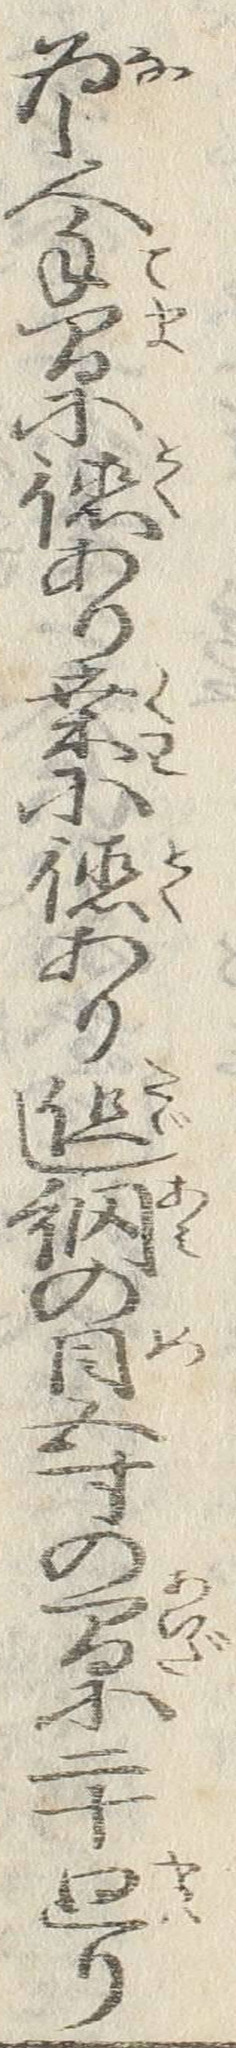為し人手間に徳あり桑に徳あり但し網の目五寸の間に二十廻り
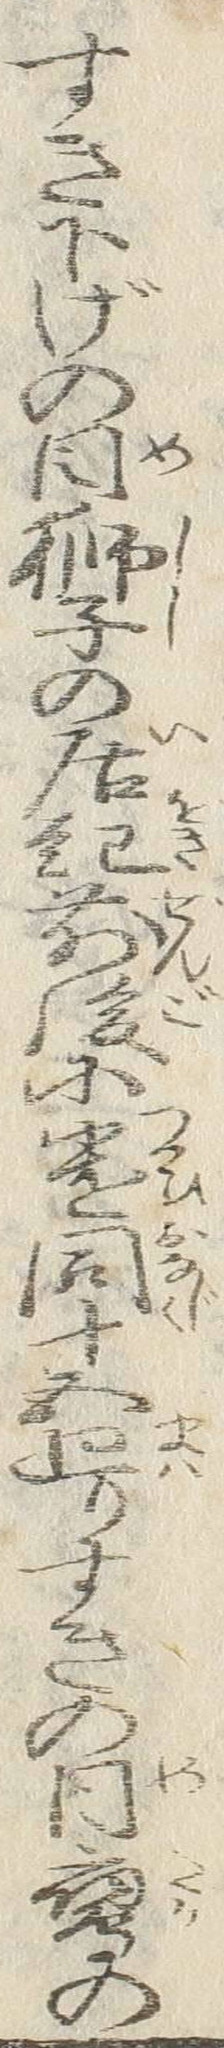すき下げの目獅子の居起前後に遣同十五廻りすきの目鷹の
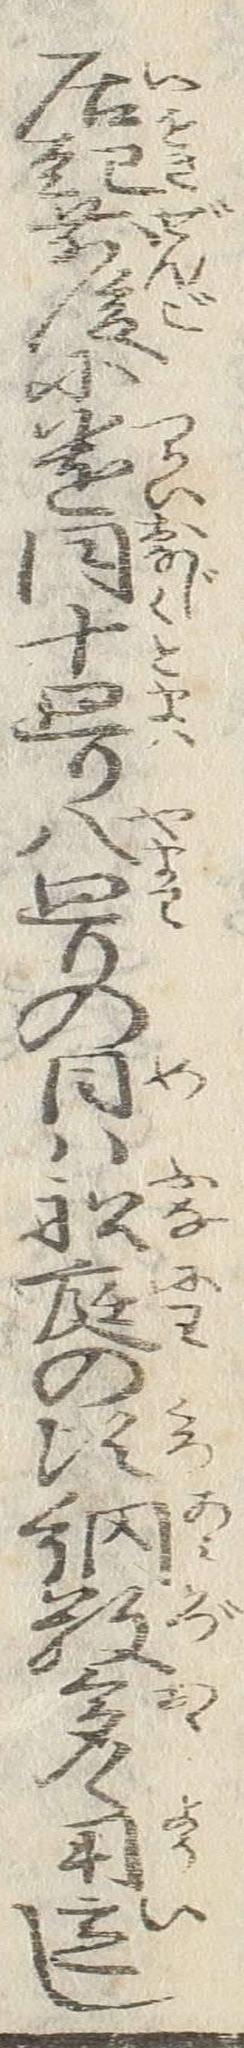居起前後に遣同十廻り八廻りの目は舩庭の頃網数多く用意し
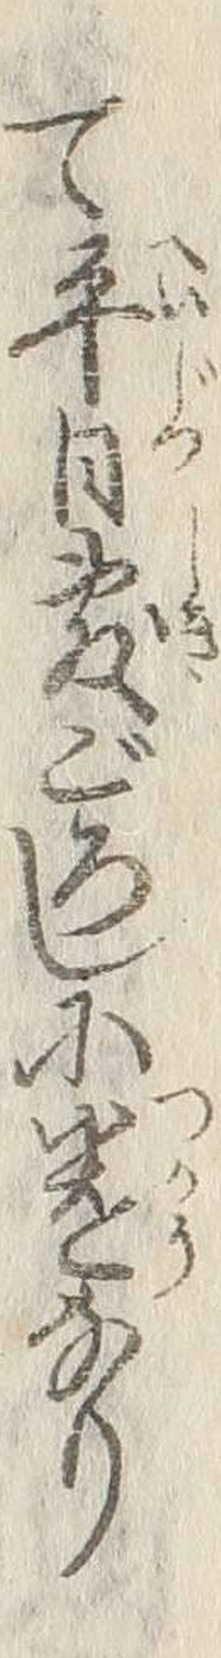て平日敷ごろしに遣なり
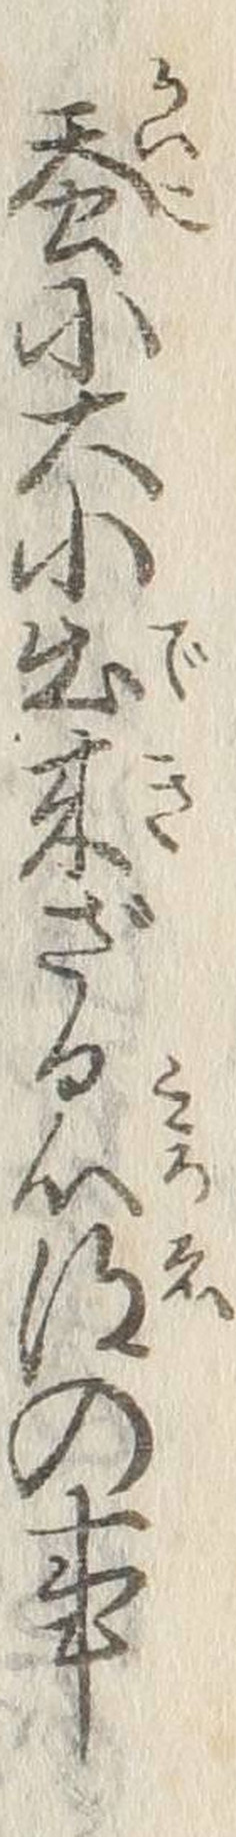蚕に大小出来ざる心得の事
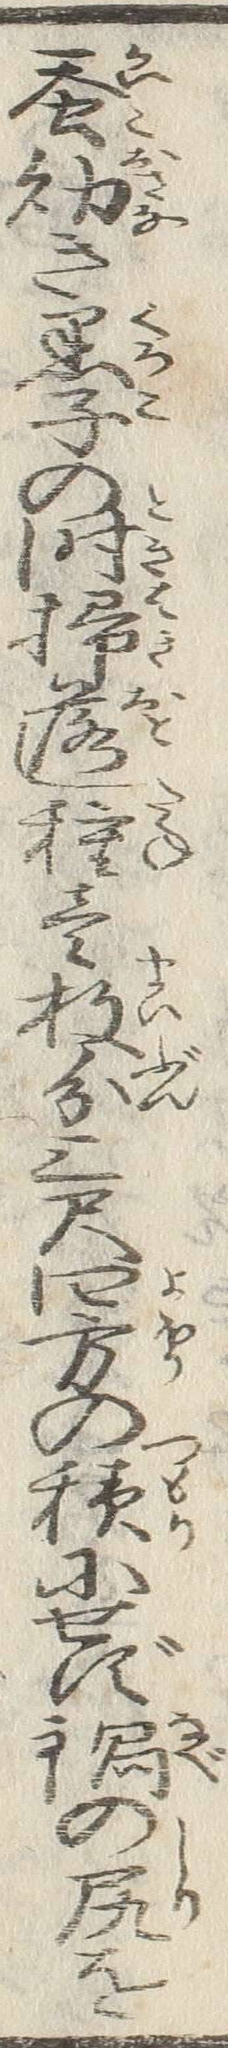蚕幼き黒子の時掃落し種壱枚分三尺四方の積にせず鍋の尻を
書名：養蠶實驗録
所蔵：東京大学農学生命科学図書館 国文学研究資料館
